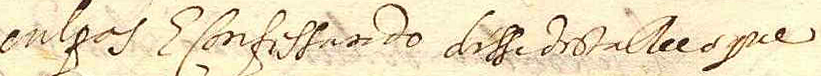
culpas E Confessando disse desta Ree o que
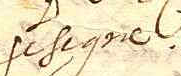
se segue.
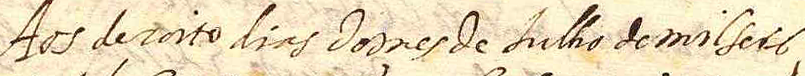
Aos dezoito dias do mes de Iulho de mil seis
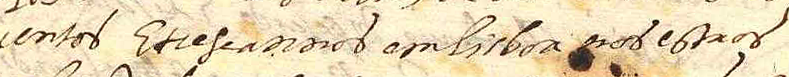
centos E trese annos em Lisboa nos estaos
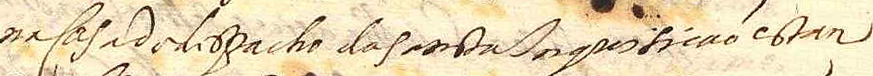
na Casa do despacho da santa Inquisicaõ estan
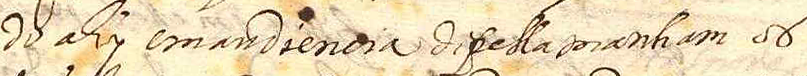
do ahy em audiencia de pella manham os
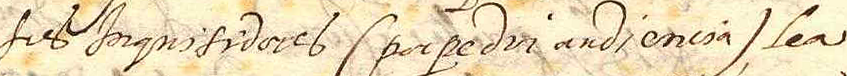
sres Jnquisidores (por pedir audiencia), Lea
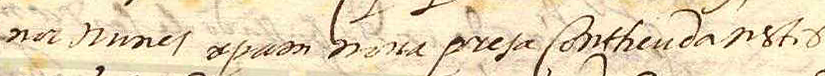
nor nunes xpam noua presa Contheuda nestes
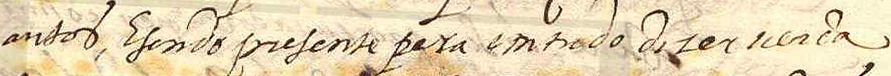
autos, E sendo presente para em tudo dizer uerda
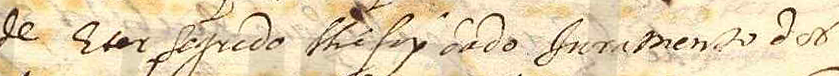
de E ter segredo lhe foy dado Juramento dos
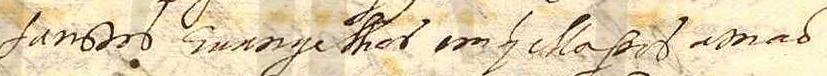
santos Euangelhos em q̄ ella pos a maõ
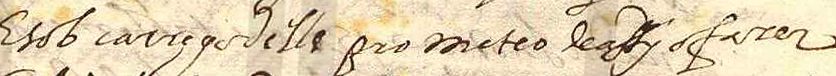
E sob carrego delle prometeo de assy o fazer
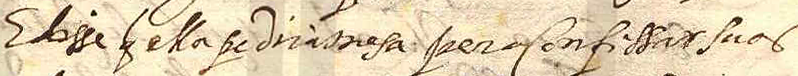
E disse q̄ ella pedira mesa pera Confissar suas
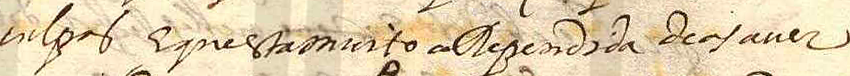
culpas E que esta muito aRependida de as auer
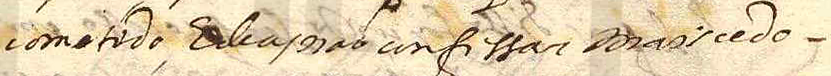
cometido, E de as naõ confissar mais cedo
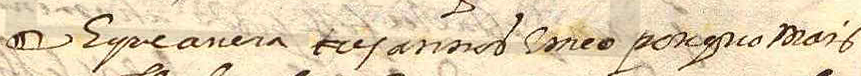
⁋ E que auera tres annos E meo pouquo mais
